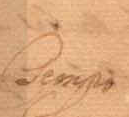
Tempo
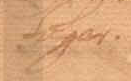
Lugar.
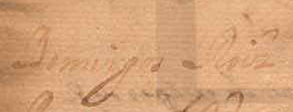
Domingos Roiz̄
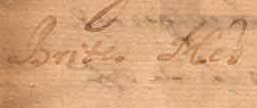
Brites Hes̄
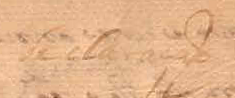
declaraçaõ
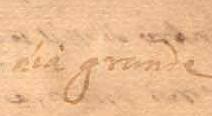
dia grande
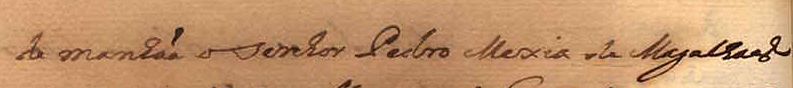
de manhaã o Senhor Pedro Mexia de Magalhaẽs
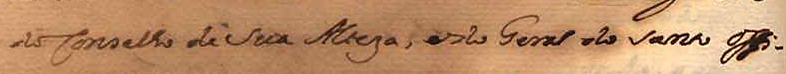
do Conselho de sua Alteza, e do Geral do santo offi
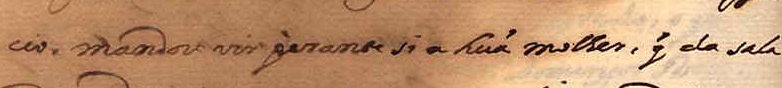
cio mandou vir perante si a huā molher, q̄ da sala
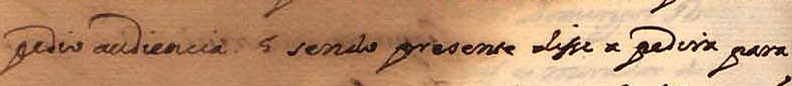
pedio audiencia E sendo presente disse a pedira para
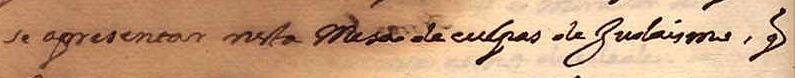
se apresentar nesta mesa de culpas de Judaismo, q̄
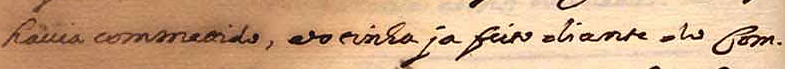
hauia commetido, e o tinha ja feito diante do Com
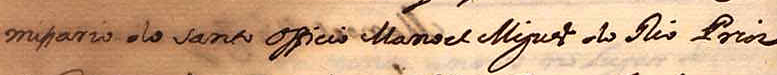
missario do santo officio Manoel Migues̄ do Rio Prior
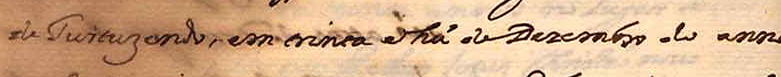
de Turtuzendo, em trinta e hū de Dezembro do anno
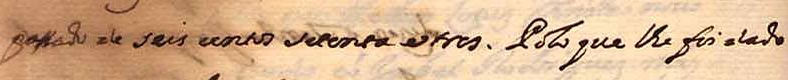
passado de seiscentos setenta e tres. Polo que lhe foi dado
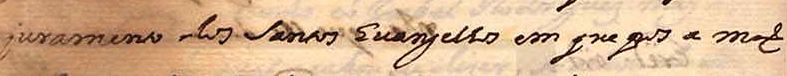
juramento dos Santos Euangelhos em que pos a maõ
